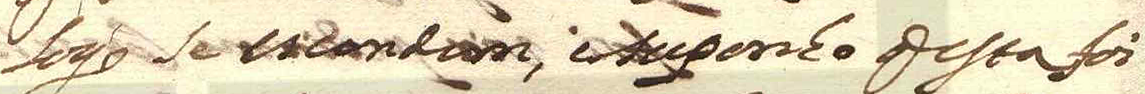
logo se escondem, e suponho q̄ esta foi
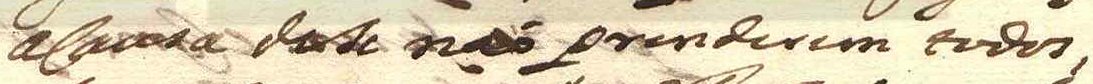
a Cauza de se naõ prenderem todos,
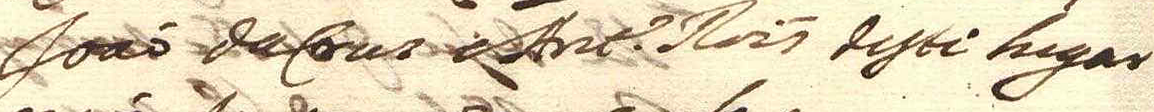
Joaõ da Crus Ant.o Rois̄ deste lugar
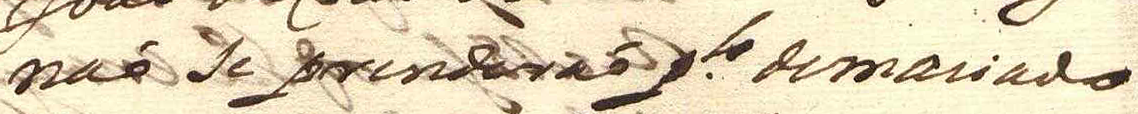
naõ se prenderaõ p.lo demaziado
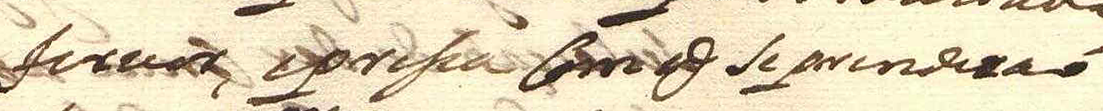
feruor, e pressa Com q̄ se prenderaõ
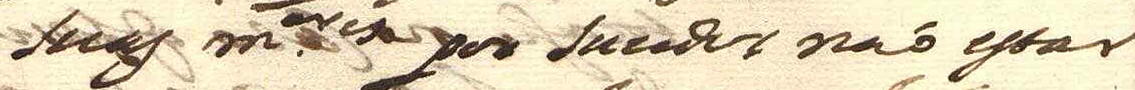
suas m.eres por suceder naõ estar
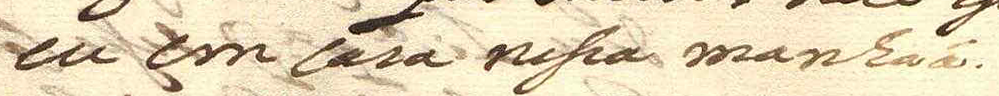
eu em caza nessa manhaā.
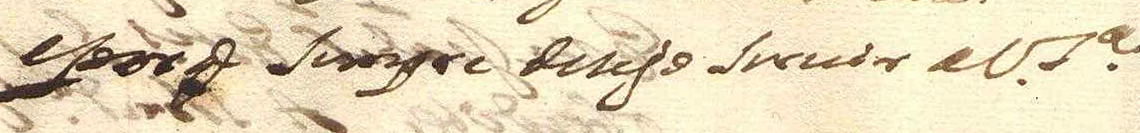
e porq̄ sempre desejo seruir a V. S.a
